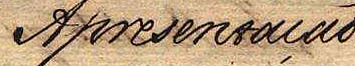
Apesentaçaõ
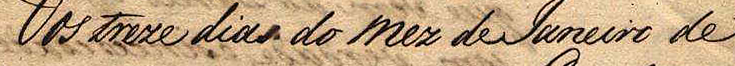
Aos treze dias do mez de Janeiro de
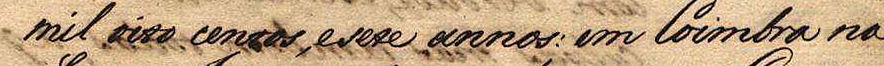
mil oitocentos, e sete annos: em Coimbra na
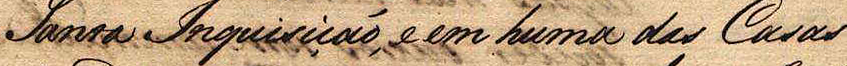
Santa Inquisiçaõ, e em huma das Casas
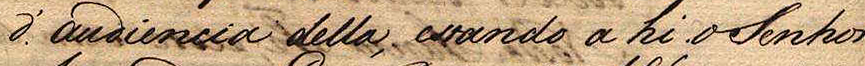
d'audiencia della, e estando ahi o Senhor
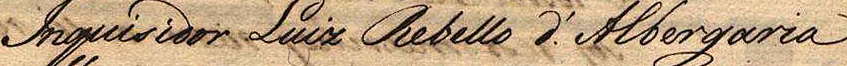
Inquisidor Luiz Rebello d'Albergaria
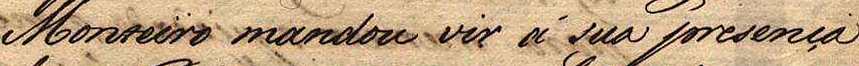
Monteiro mandou vir á sua presença
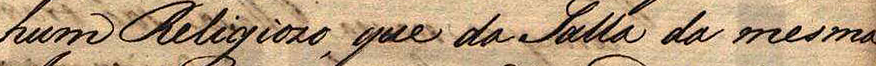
hum Religiozo, que da Salla da mesma
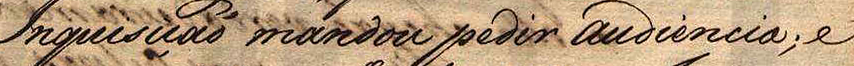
Inquisiçaõ mandou pedir audiencia; e
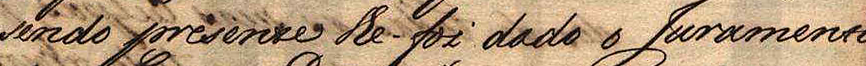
sendo presente lhe-foi dado o Juramento
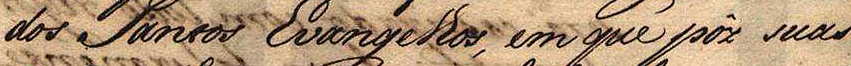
dos Santos Evangelhos, em que pôz suas
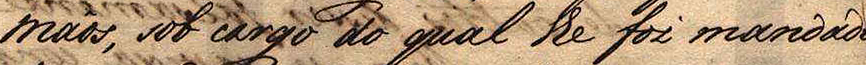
maõs, sob cargo do qual lhe foi mandado
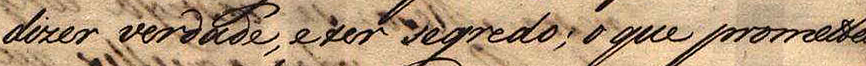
dizer verdade, e ter segredo; o que prometteo
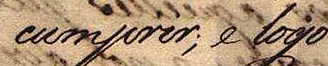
cumprir; e logo
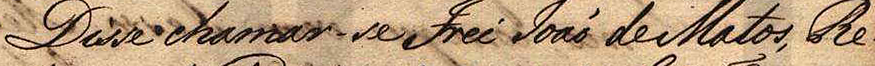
Disse chamar-se Frei Joaõ de Matos, Re
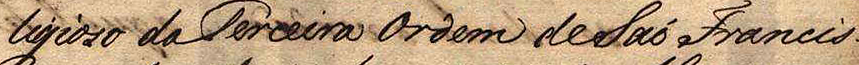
ligiozo da Terceira Ordem de Saõ Francis
